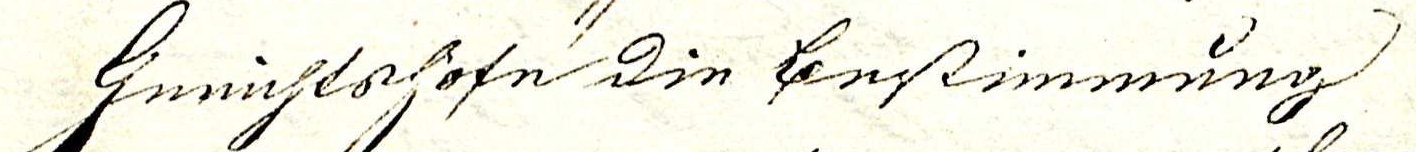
Gerichtshofe die Bestimmung
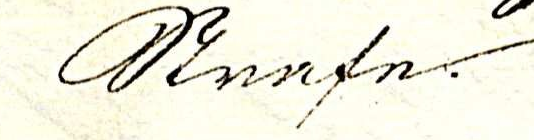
Strafe.
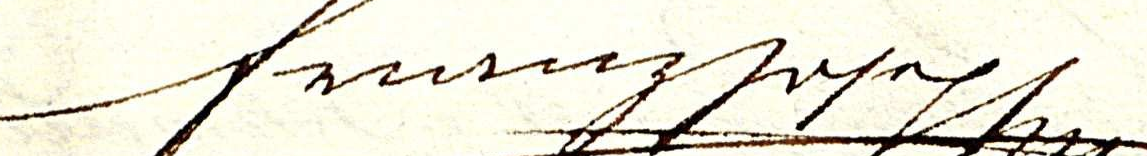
Franz Joseph
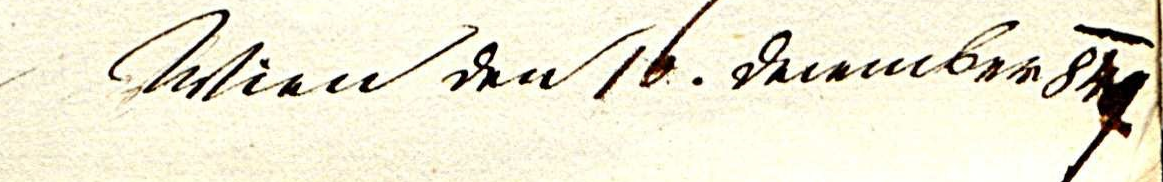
Wien den 16. December 849.
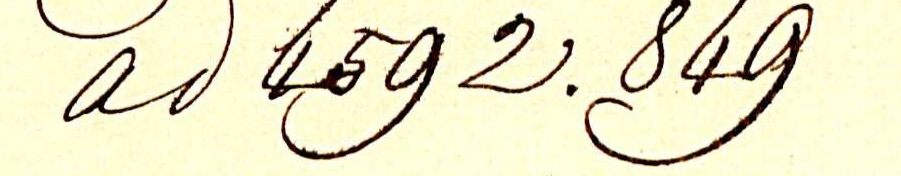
ad 459 2. 849
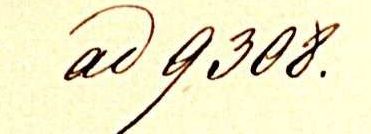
ad 9308.
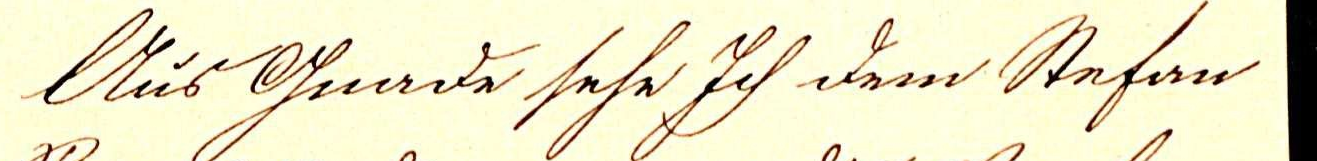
Aus Gnade sehe Jch dem Stephan
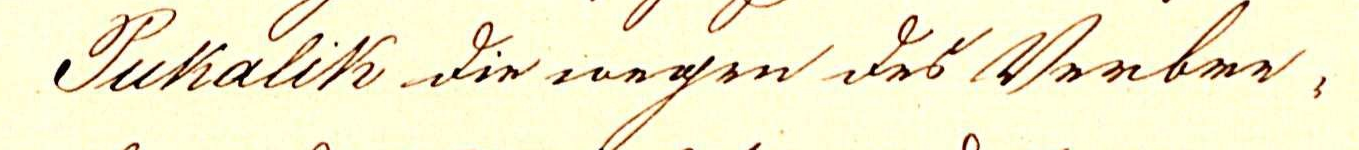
Pukalik die wegen des Verbre¬
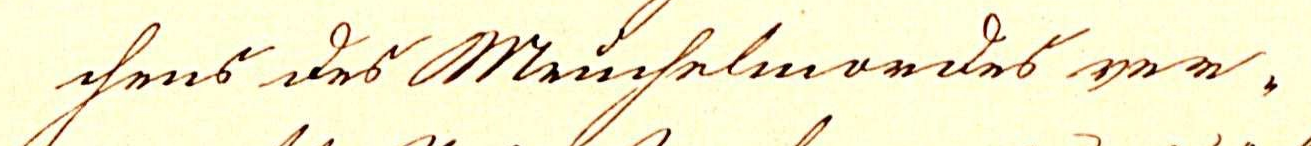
chens des Meuchelmordes ver¬
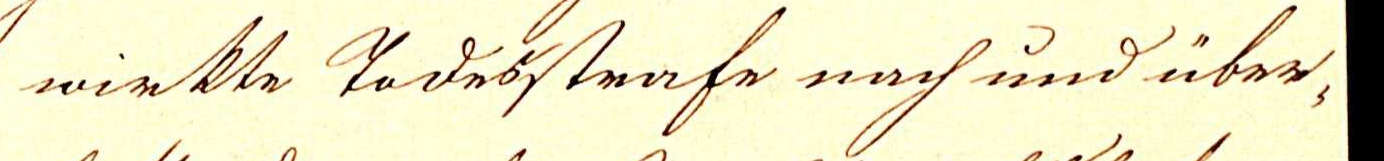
wirkte Todesstrafe nach und über¬
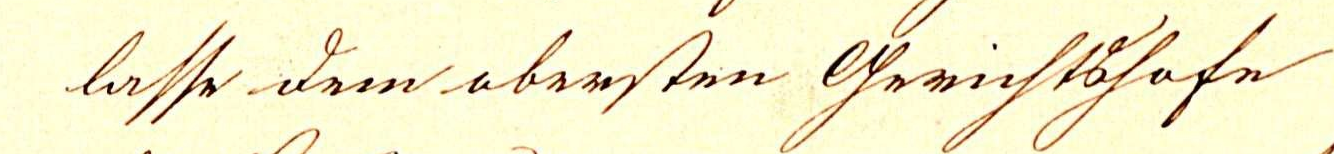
lasse dem obersten Gerichtshofe
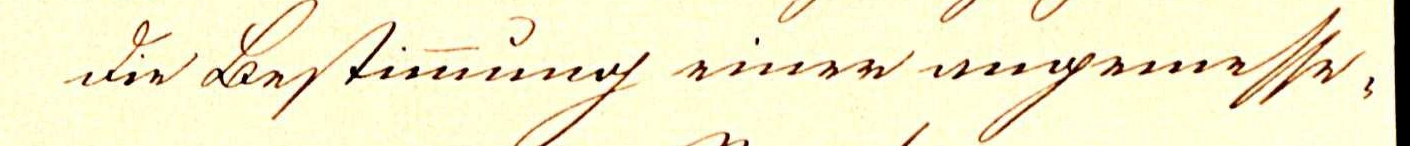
die Bestimmung einer angemesse¬
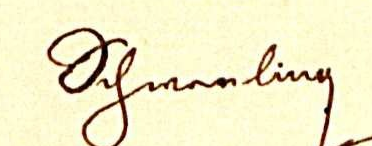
Schmerling
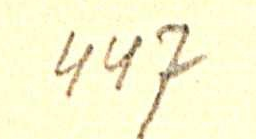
447
